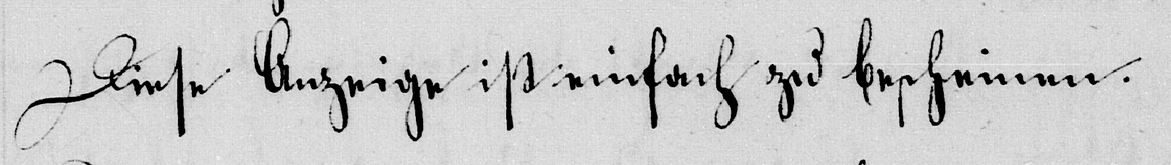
Diese Anzeige ist einfach zu bescheinen.
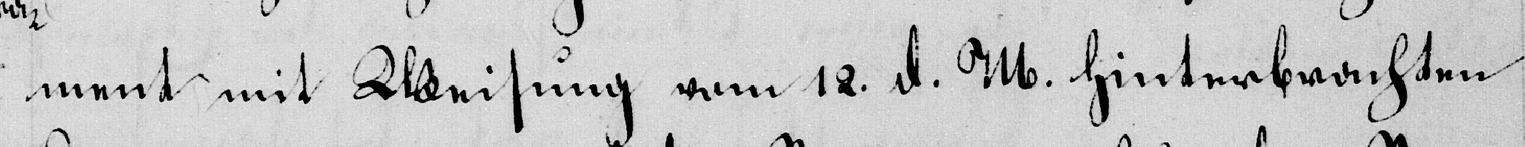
ment mit Weisung vom 12. d. M. hinterbrachten
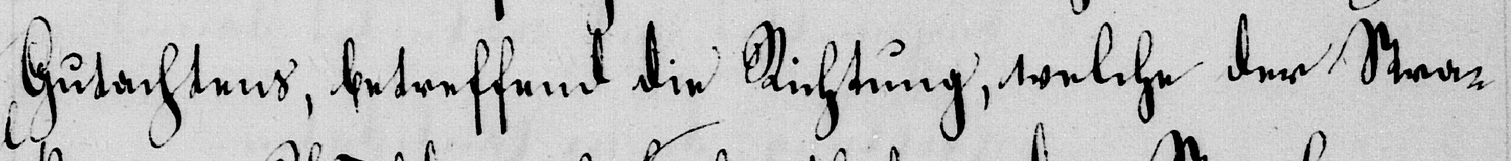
Gutachtens, betreffend die Richtung, welche der Stra¬
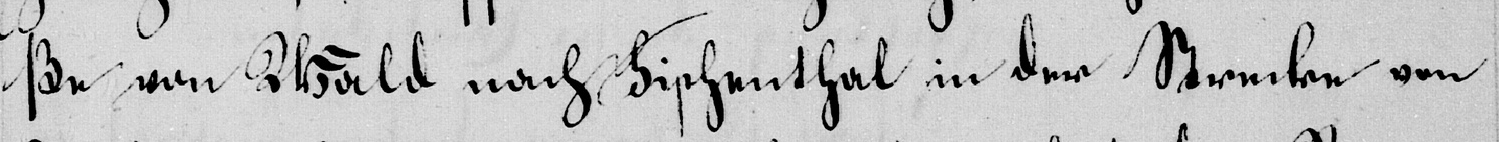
ße von Wald nach Fischenthal in der Strecke von
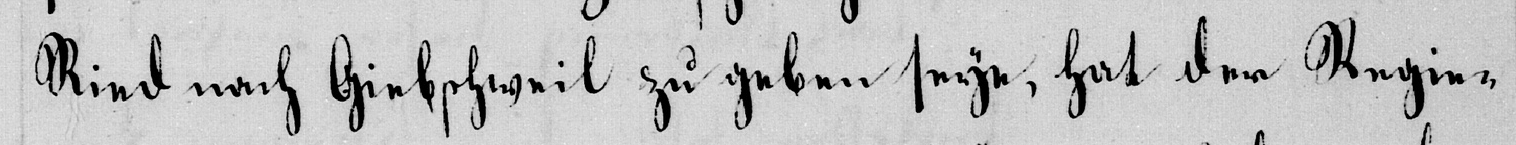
Ried nach Giebschweil zu geben seye, hat der Regie¬
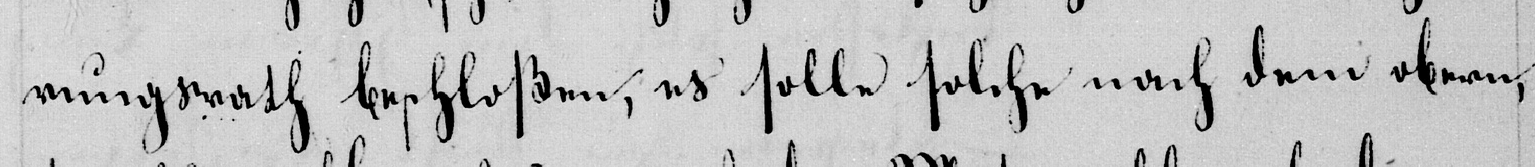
rungsrath beschloßen, es solle solche nach dem obern,
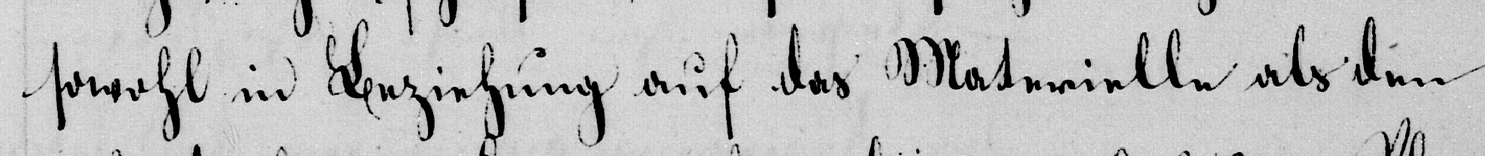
sowohl in Beziehung auf das Materielle als den
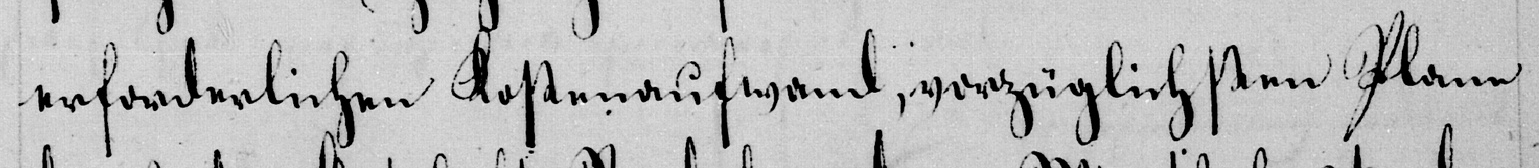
erforderlichen Kostenaufwand, vorzüglichsten Plane
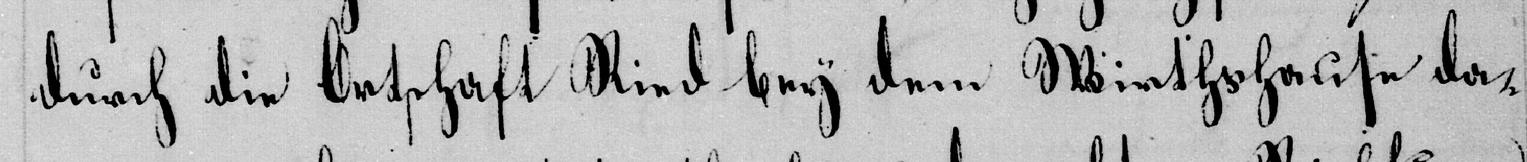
durch die Ortschaft Ried bey dem Wirthshause da¬
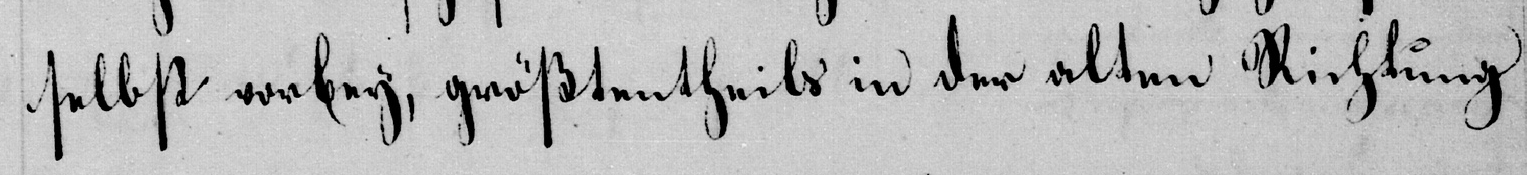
selbst vorbey, größtentheils in der alten Richtung
